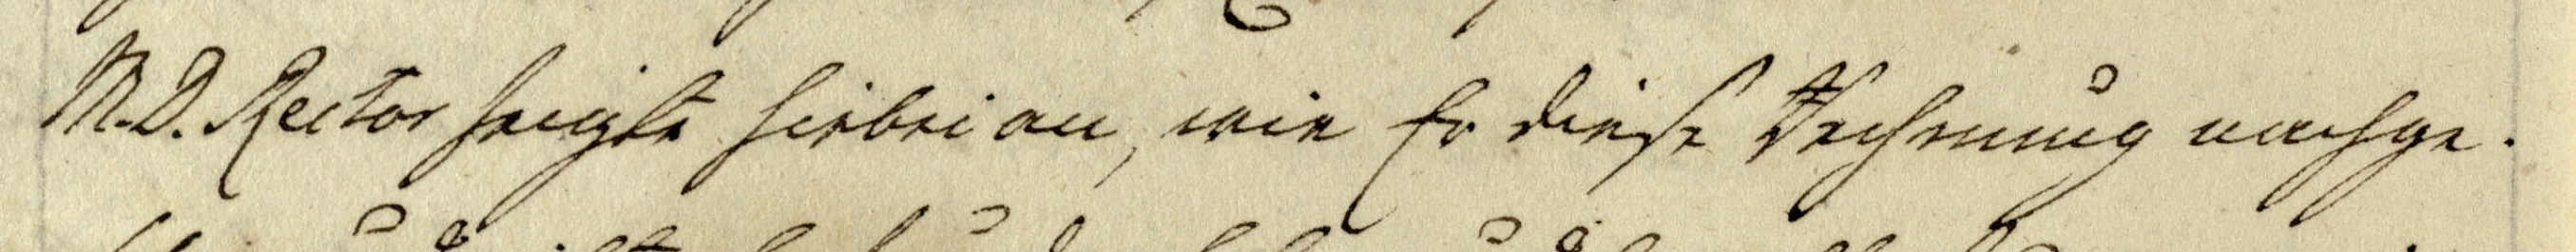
M. D. Rector zeigte hiebei an, wie Er diese Rechnung nachge¬
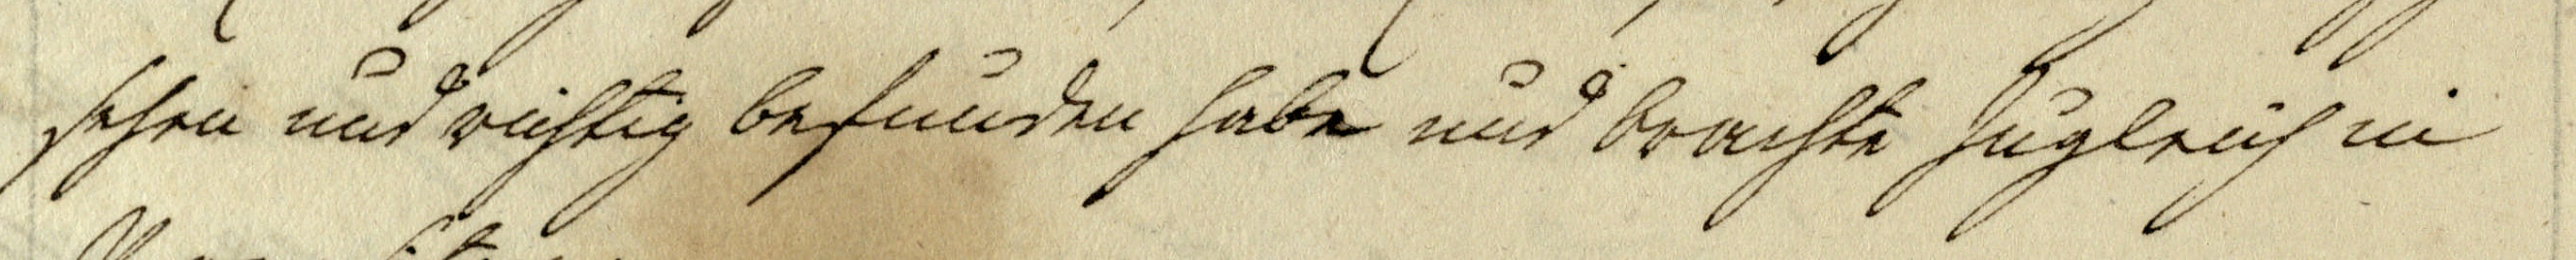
sehen und richtig befunden habe und brachte zugleich in
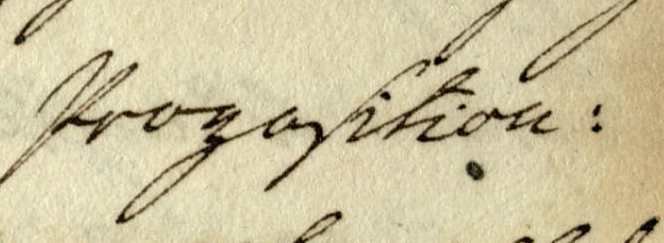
Proposition:
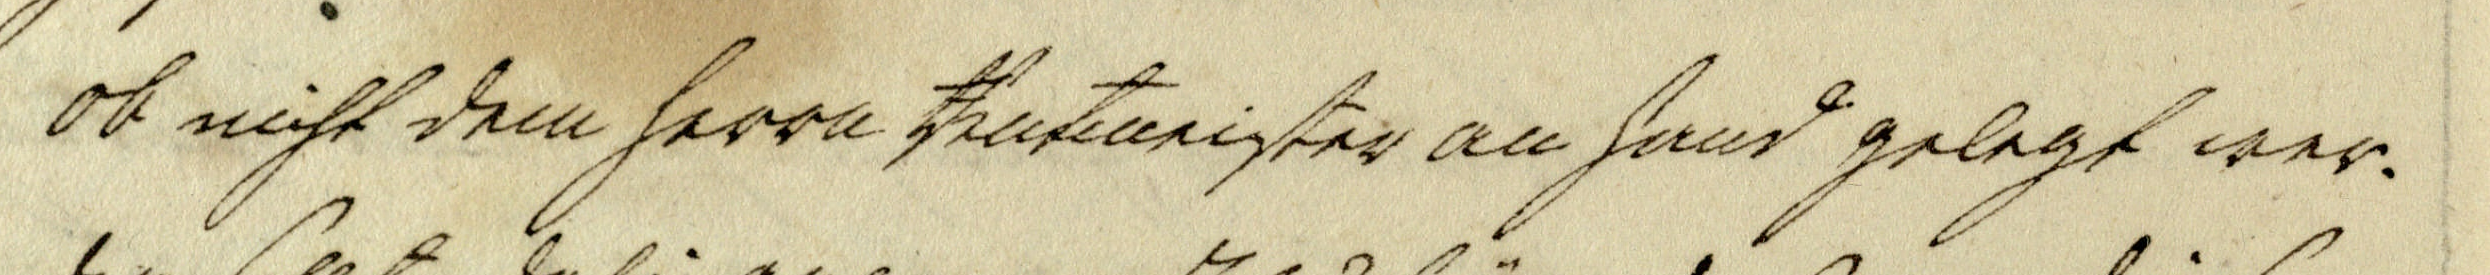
ob nicht dem Herrn Rentmeister an Hand gelegt wer¬
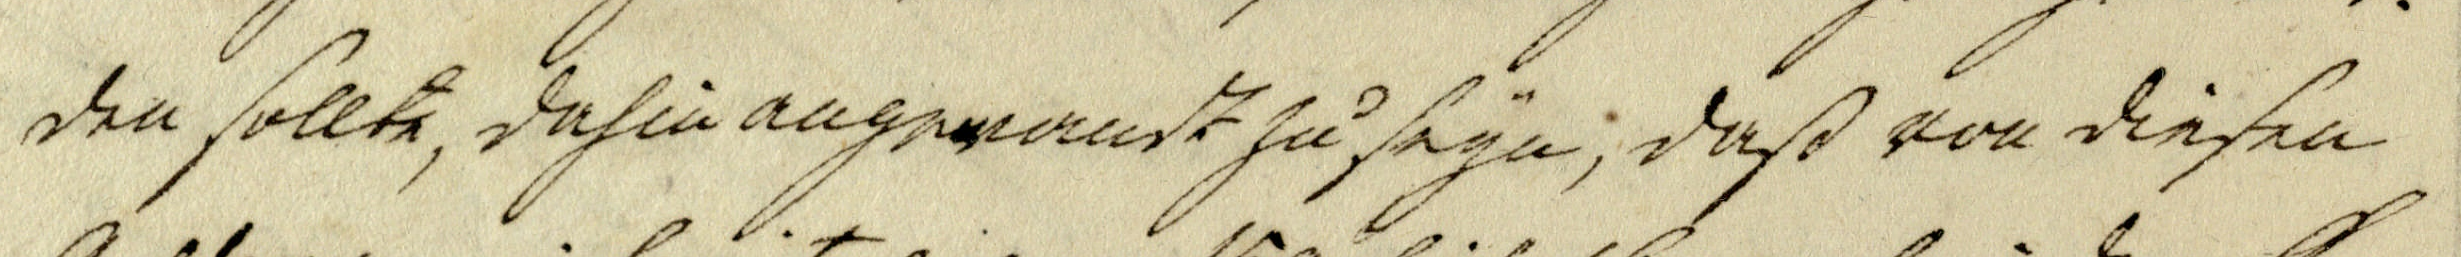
den sollte, dahin angewandt zu seÿn, daß von diesen
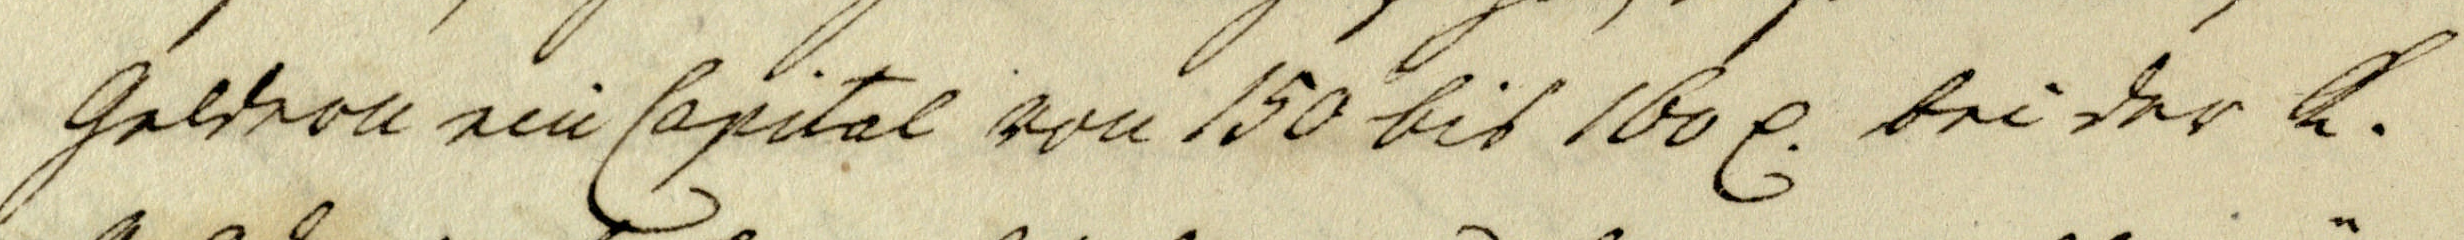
Geldern ein Capital von 150 bis 100 l. bei der K.
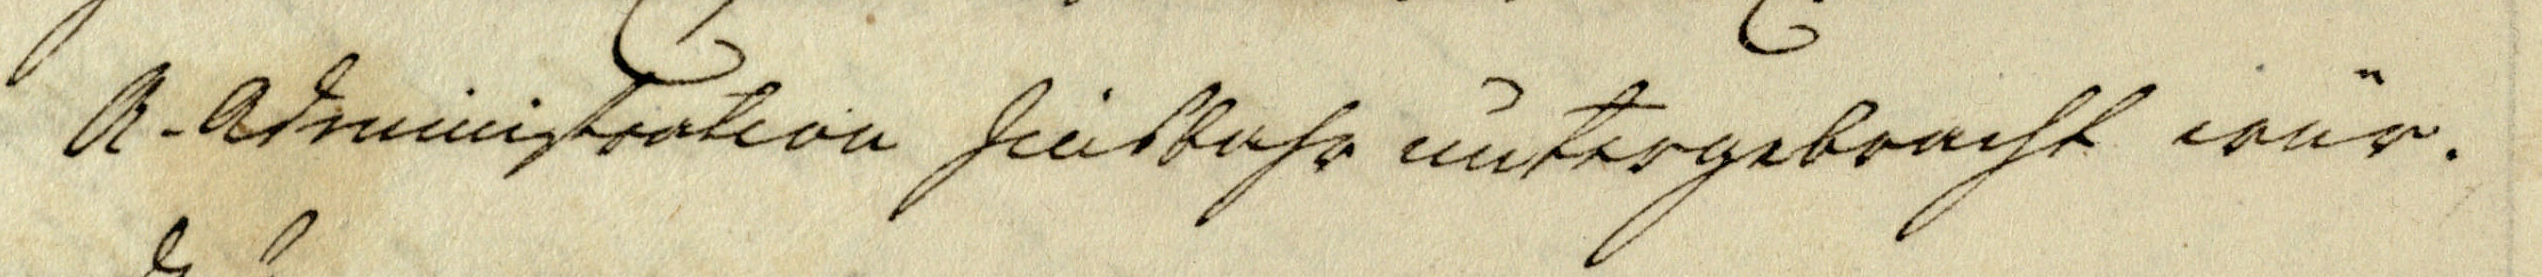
A. Administration zinsbahr untergebracht wür¬
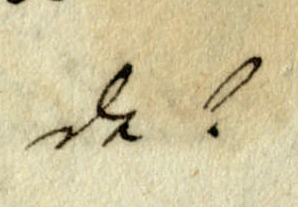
de?
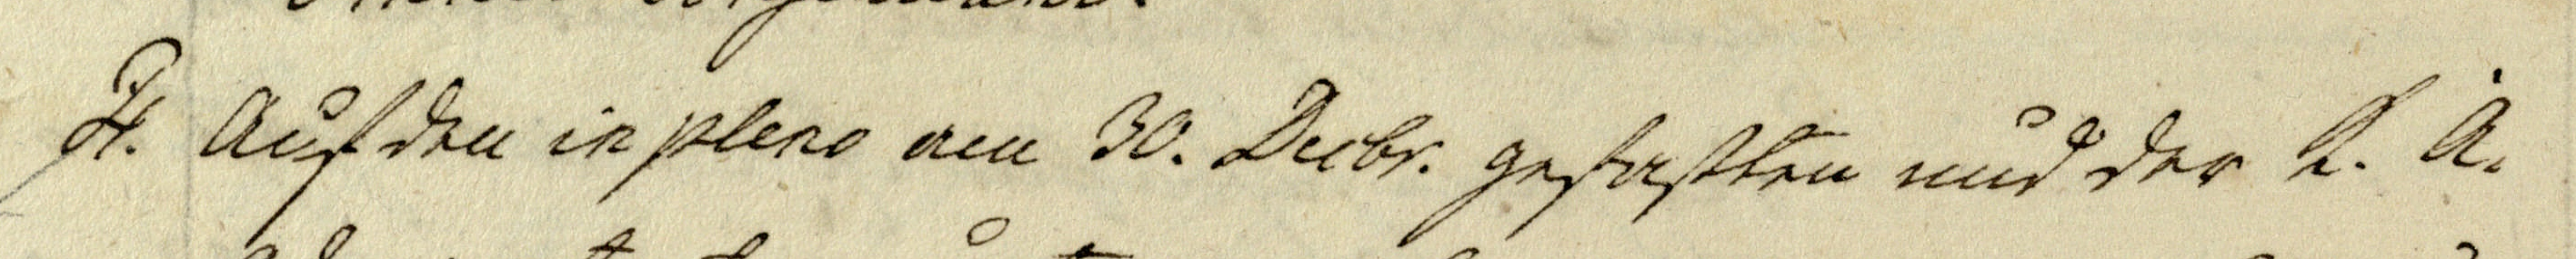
4. Auf den in pleno am 30. Decbr. gefaßten und der K. A.
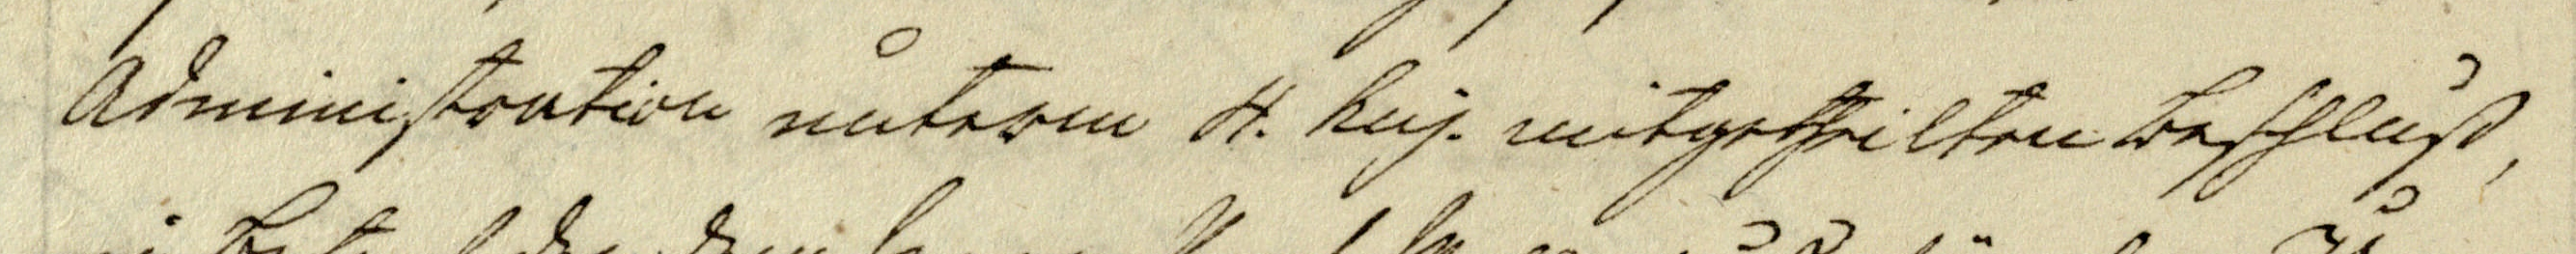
Administration unterm 4. huj. mitgetheilten Beschluß,
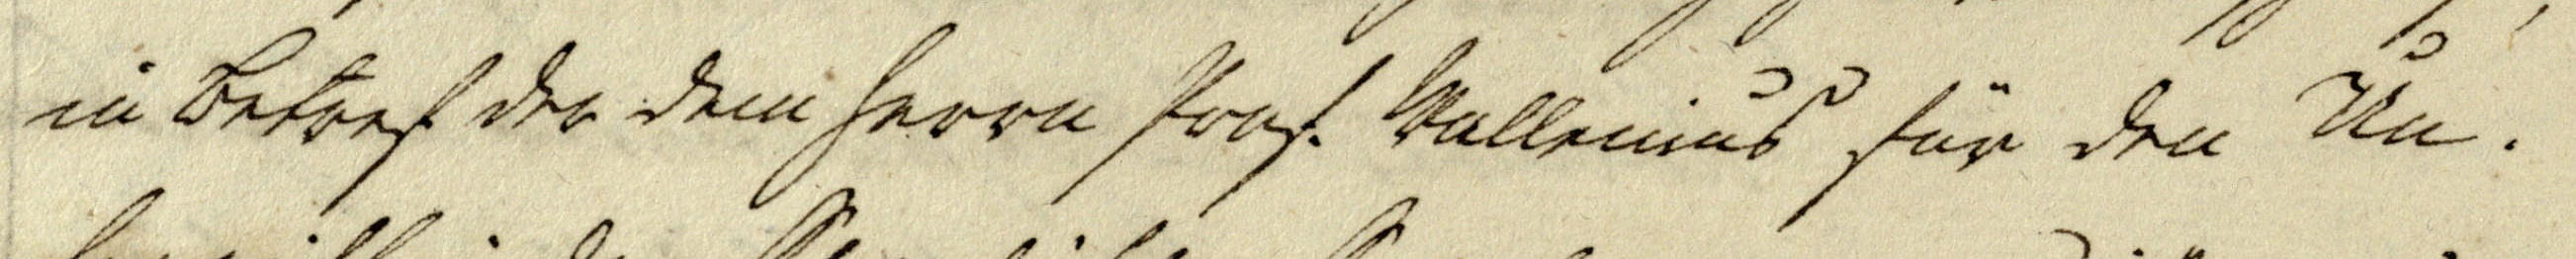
in Betref der dem Herrn Prof. Wallenius für den Un¬
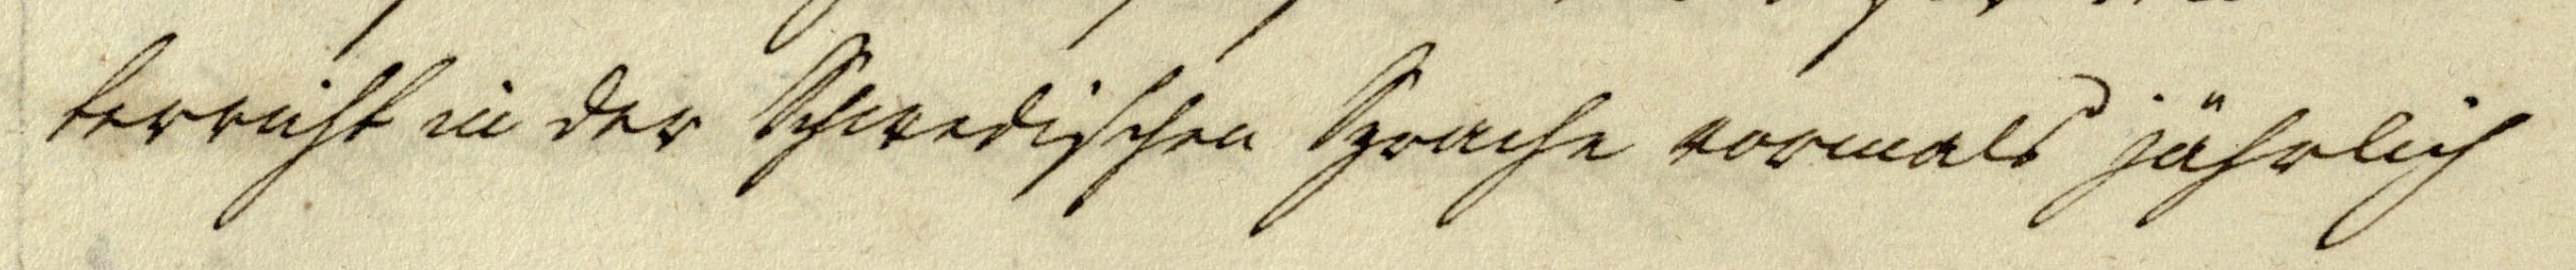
terricht in der Schwedischen Sprache vormals jährlich
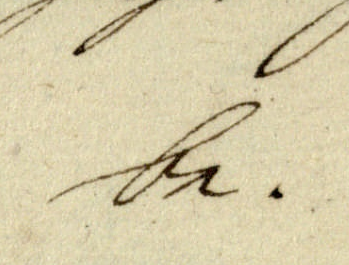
be.
